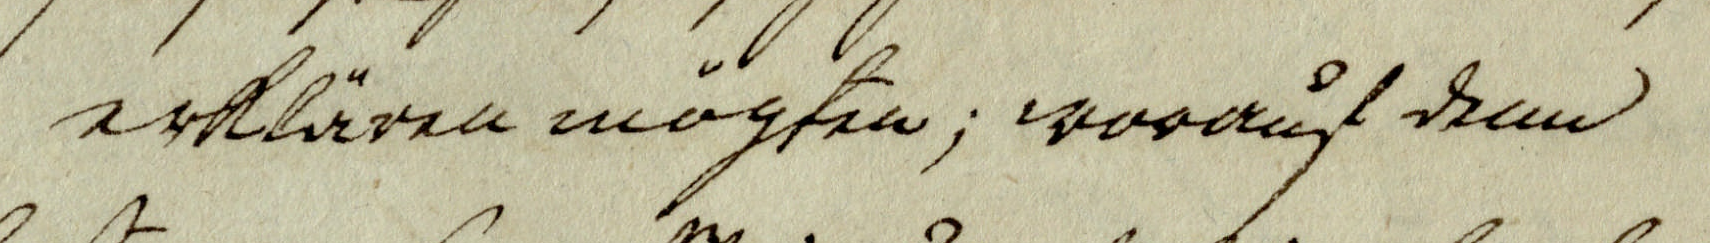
erklären mögten; worauf denn
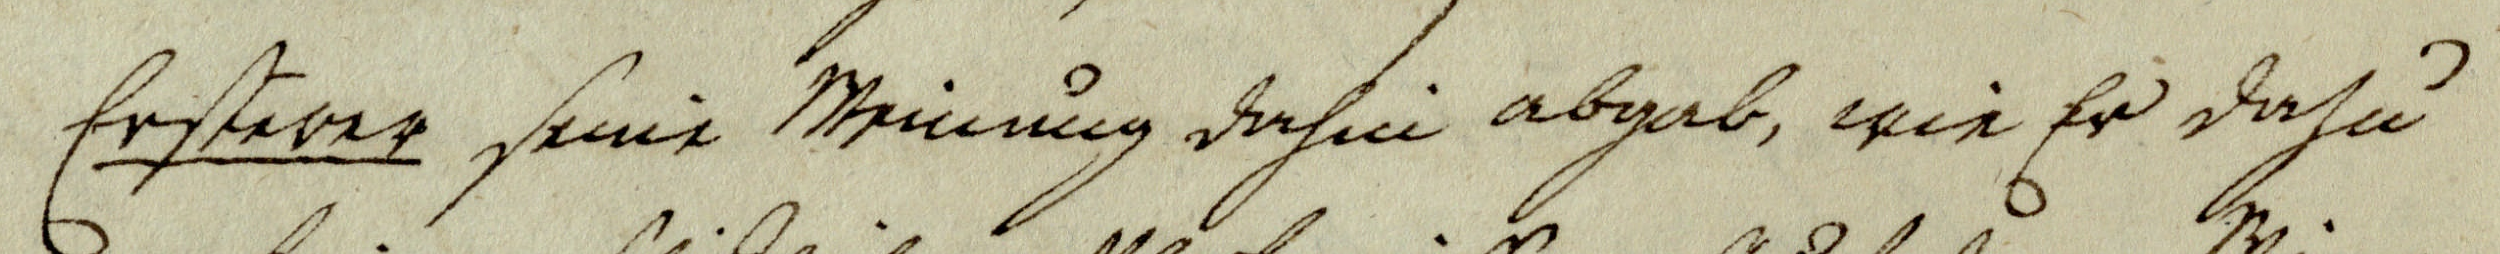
Ersterer seine Meinung dahin abgab, wie Er dazu
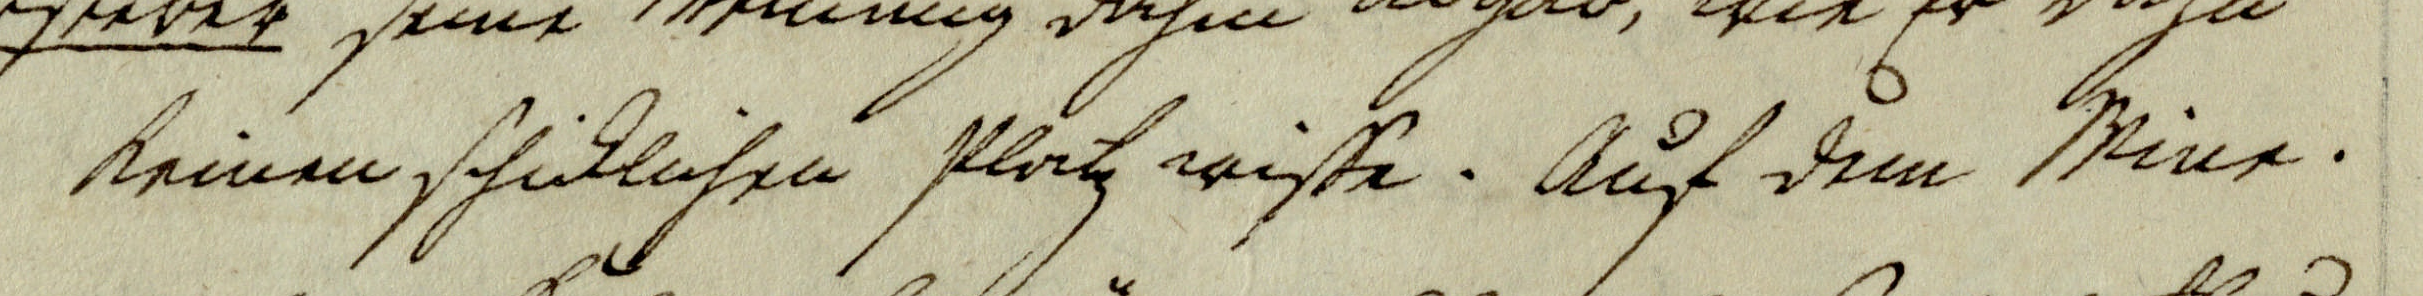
keinen schicklichen Platz wisse. Auf dem Mine¬
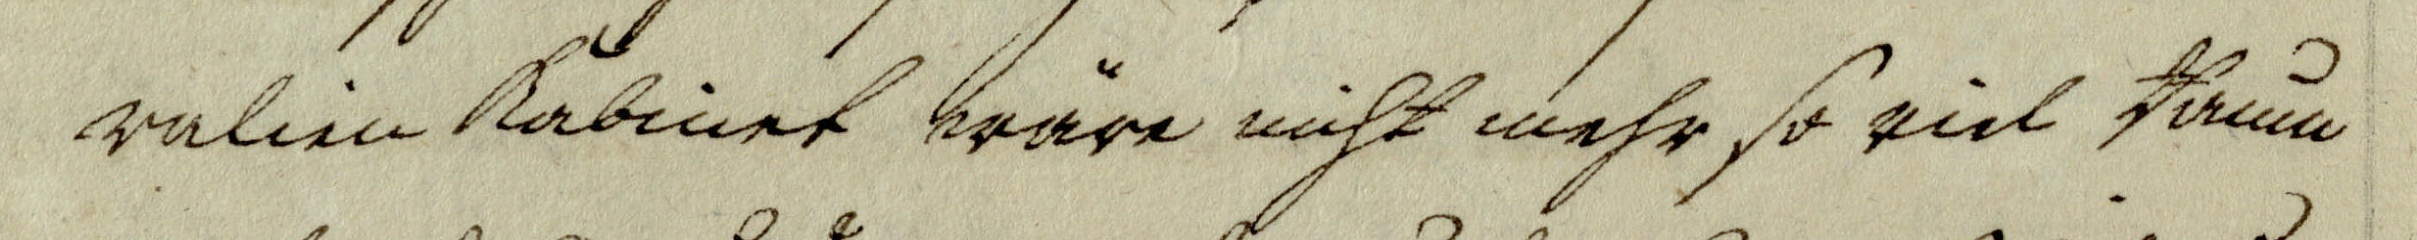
ralien Kabinet wäre nicht mehr so viel Raum
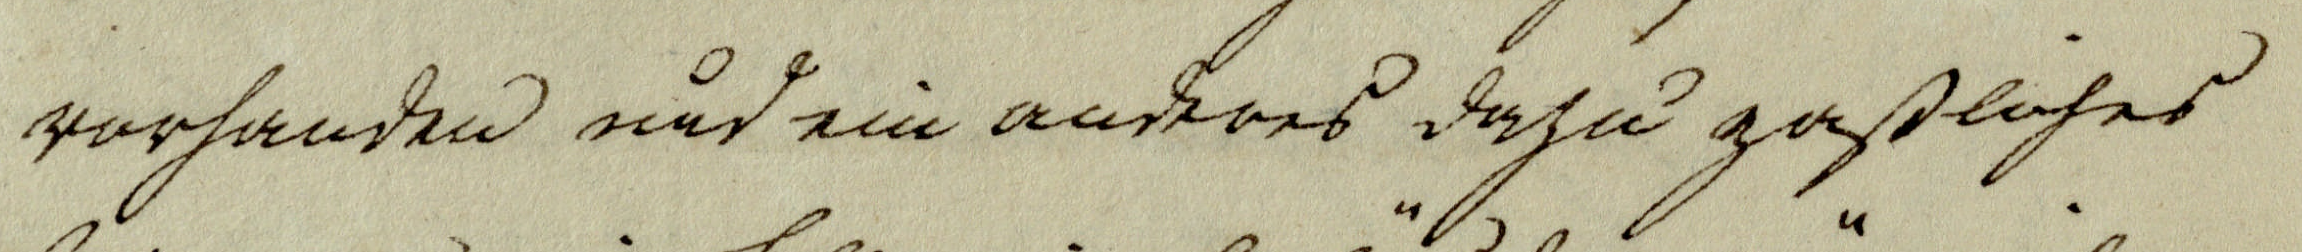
vorhanden und ein anderes dazu paßliches
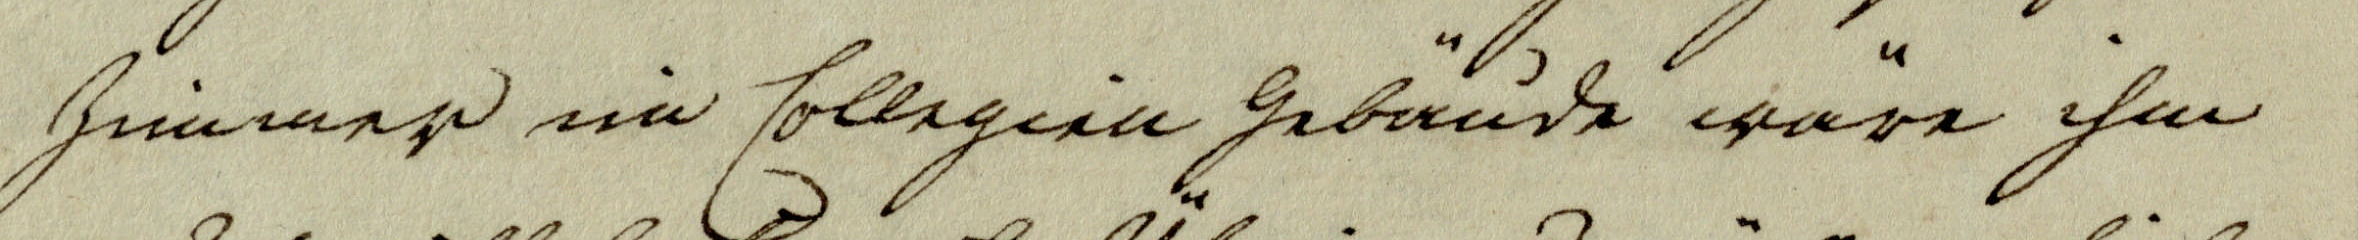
Zimmer im Collegien Gebäude wäre ihm
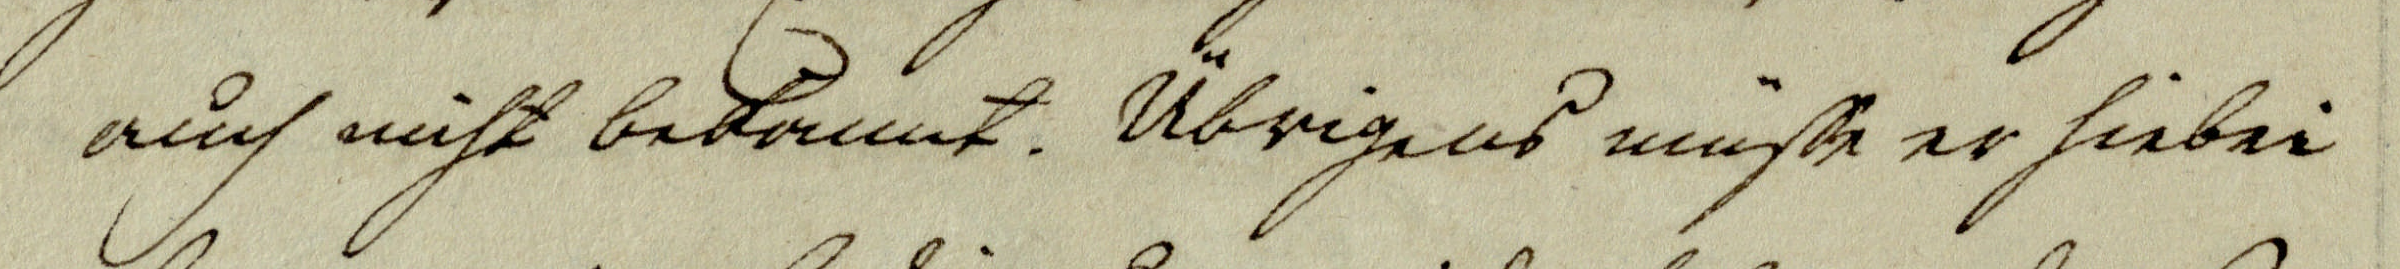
auch nicht bekannt. Übrigens müsse er hiebei
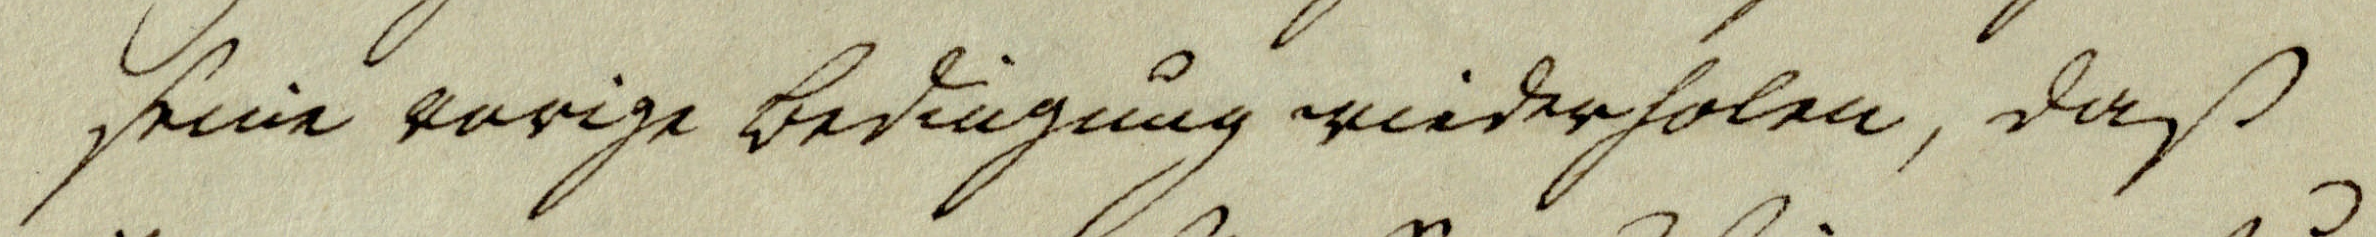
seine vorige Bedingung wiederholen, daß
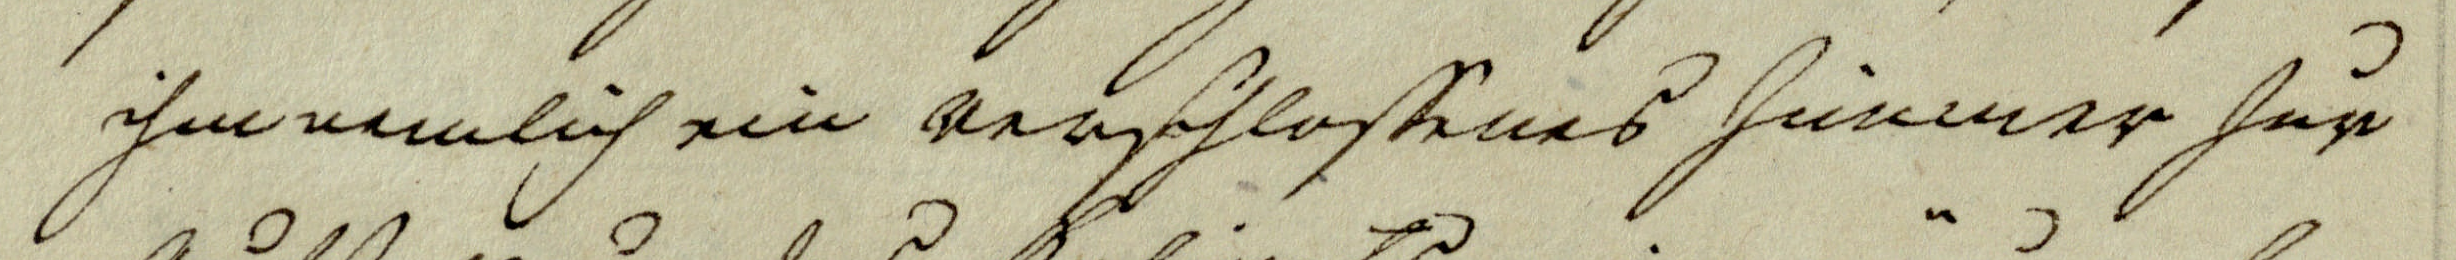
ihm nemlich ein verschlossenes Zimmer zur
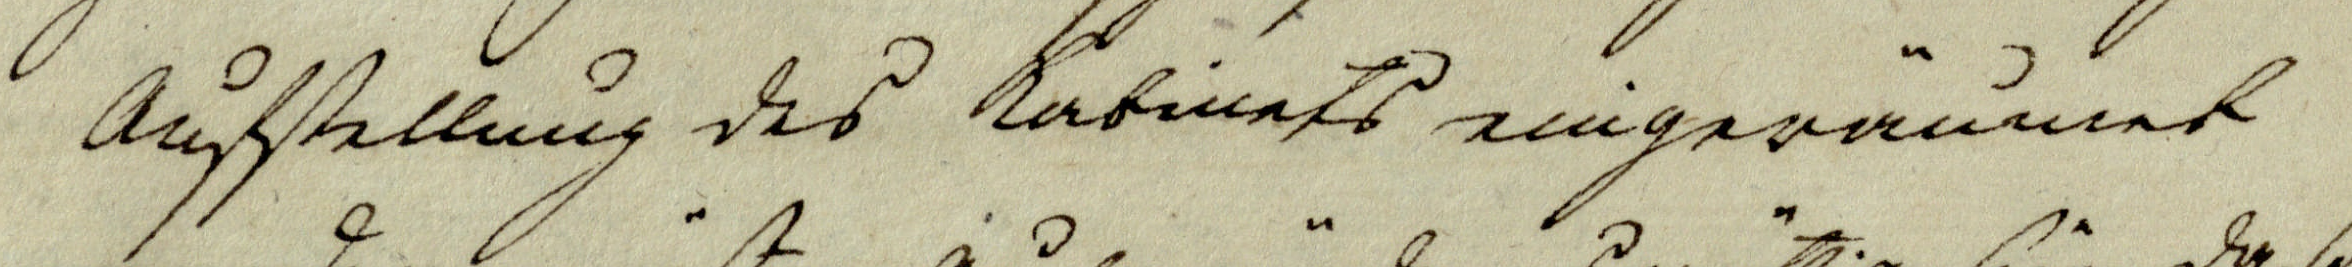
Aufstellung des Kabinets eingeräumet
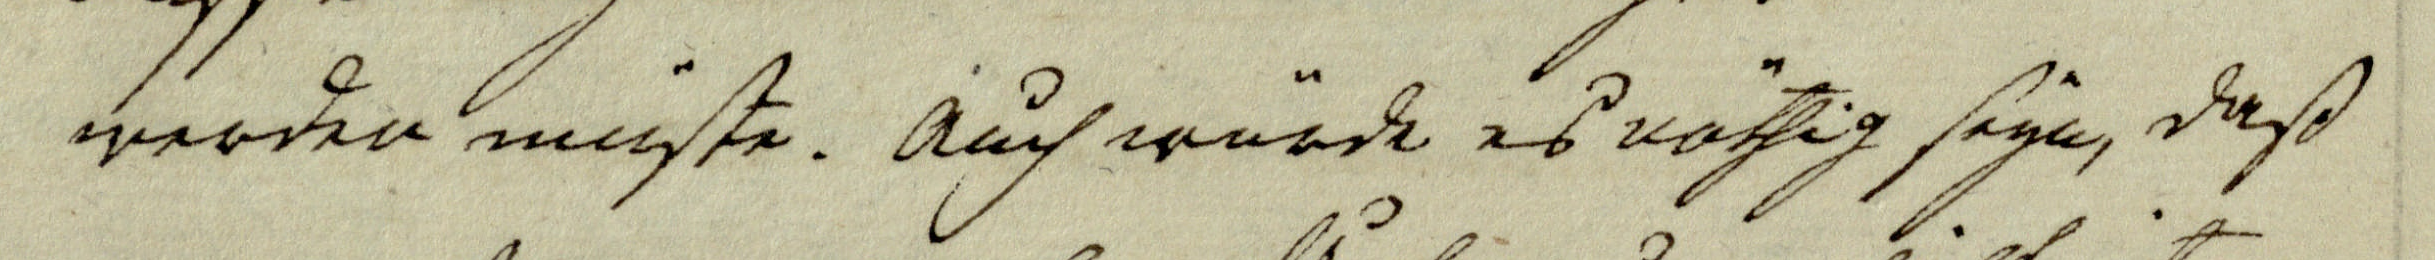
werden müßte. Auch würde es nöthig seÿn, daß
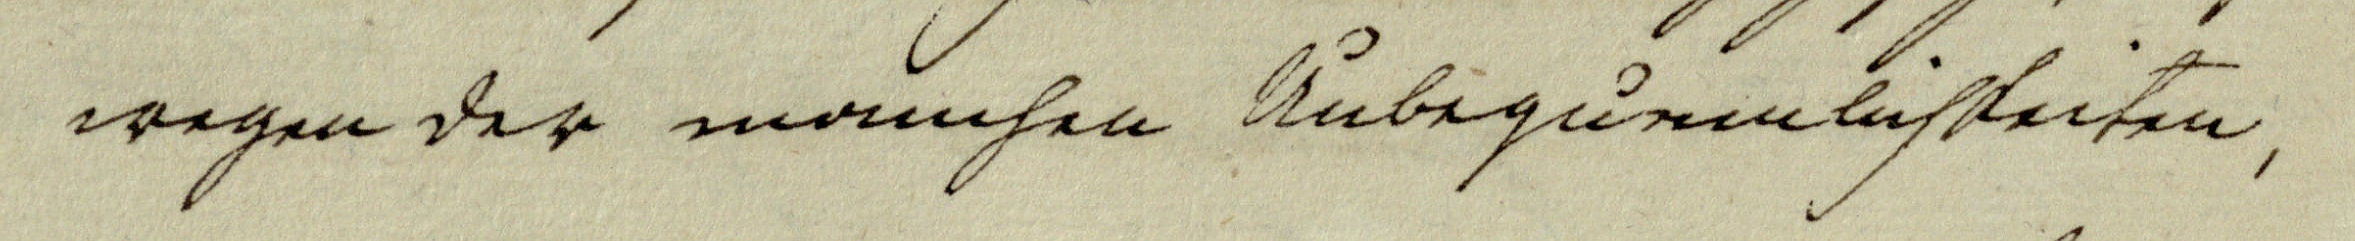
wegen der manchen Unbequemlichkeiten,
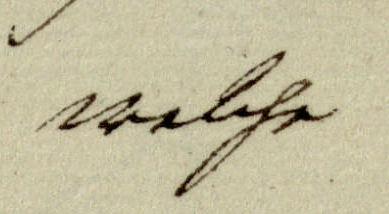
welche
